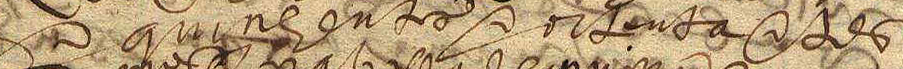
e quinhentos e oitenta e tres
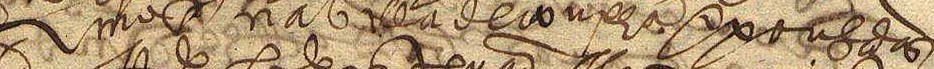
Annos na villa de coujlhā e pousadas
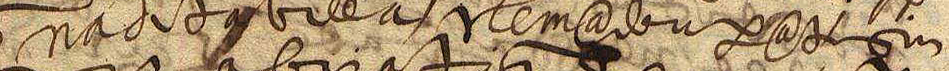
na dita villa / ele mādou ꝑāte sim
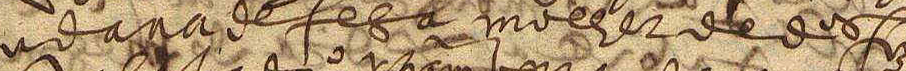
uda na defesa molher de dos frz̄
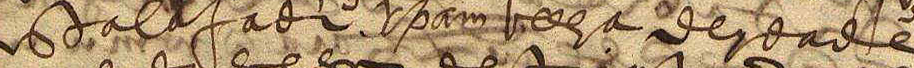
estalaJadro xpām velha de jdade
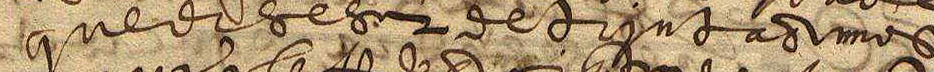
que dise ser de trjnta Annos
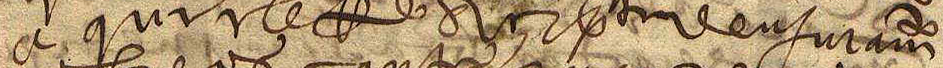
a quē ele Rdo Açip̄te deu Juramto
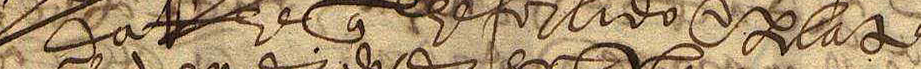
da Rhe q̄ lhe foj lido e ꝑ ela ta
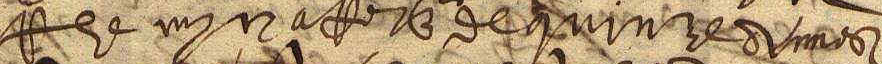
a Rhe mjçia Roiz̄ de quinze Annos
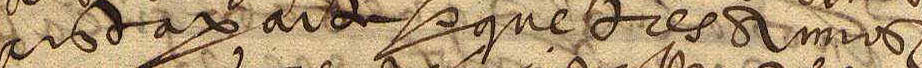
a esta parte / e que tres Annos
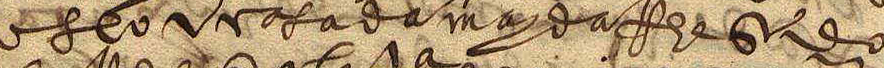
coseo ē casa da maj da Rhe sēdo
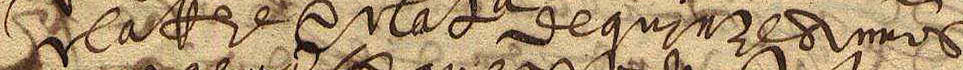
ela Rhe e ela ta de qujnze Annos
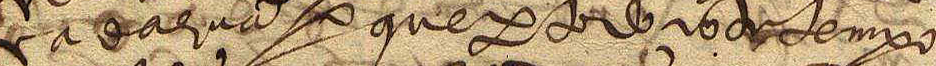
cada huā / e que ꝑ todo este tempo
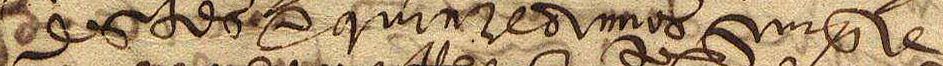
dos tres e quinze Annos sempre
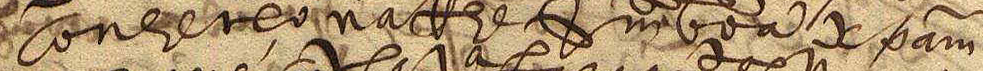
conheçeo na Rhe ꞩ mto boa xpam̄
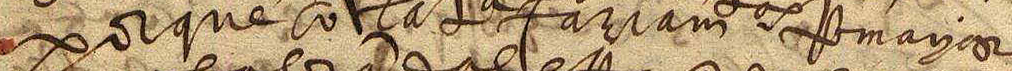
porque cō ela ta fazia mtas Romarjas
